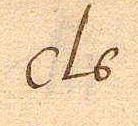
CLb
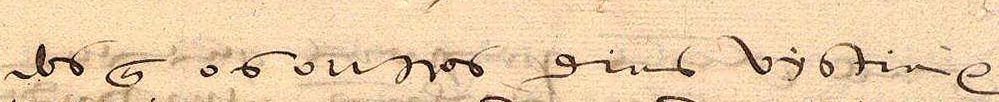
dos q̄ os outros dias vystia e
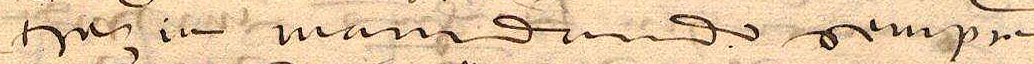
trazia mamdando sempre
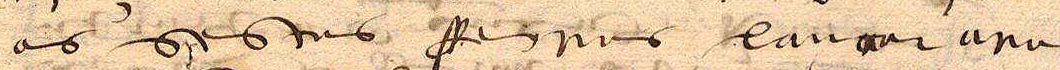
as sestas ffeyrras lançar arra
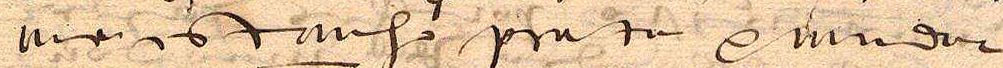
me estanho prata e mudar
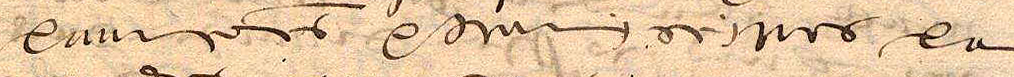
lamçoes e trauyseyrros la
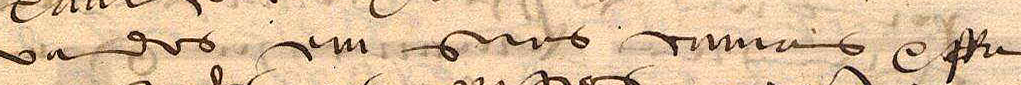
vados em suas camas e ffa
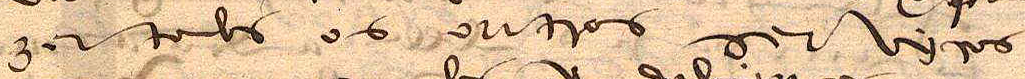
zer todos os outros servyços
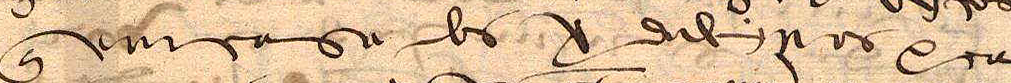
q̄ em casa dos ꝟdadeyros e ca
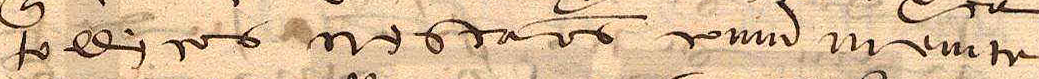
tollycos crystaõs comummemte
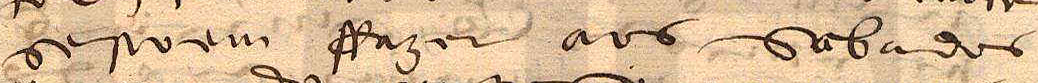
se ssoem ffazer aos sabados
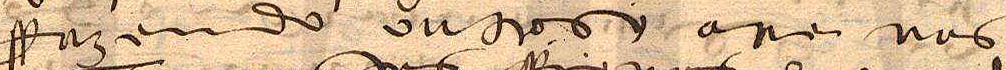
ffazendo outrosy a rre nas
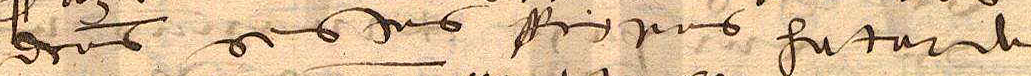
dtās sestas ffeyras ha tarde
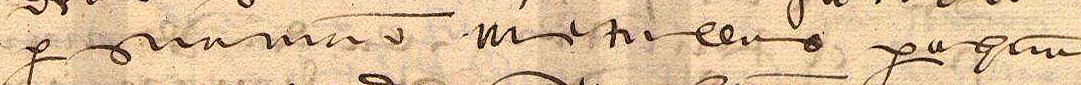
ꝑ sua mão metullas ꝑa huā
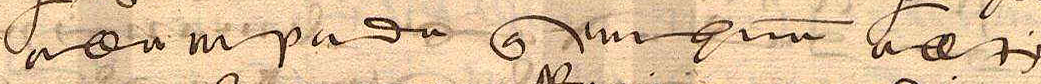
allampada q̄ em huā allty
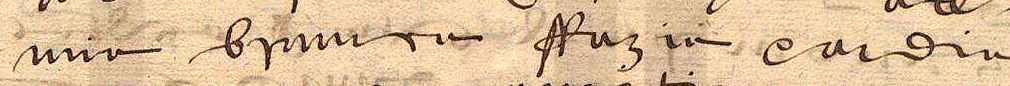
mia bramca ffazia e ardia
